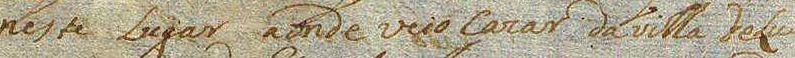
neste Lugar aonde veio cazar da villa de Lu
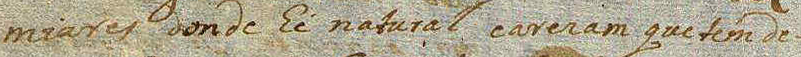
miares donde hé natural e a rezam que tem de
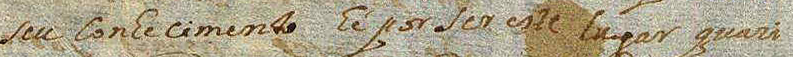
seu conhecimento hé por ser este lugar quazi
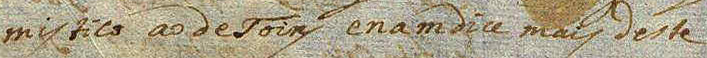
mistico ao de Toins e nam dice mais deste
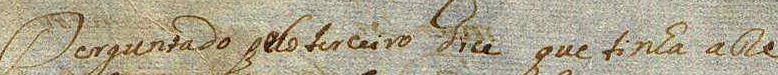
Perguntado pelo terceiro dice que tinha a Re
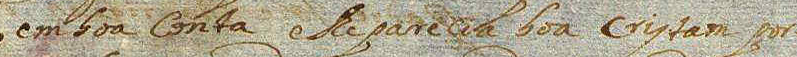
em boa Conta e lhe parecia boa cristam por
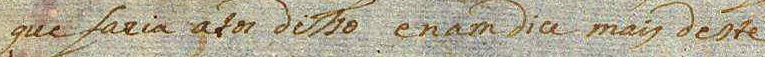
que fazia atos disso e nam dice mais deste
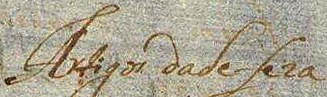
Artigos da defeza
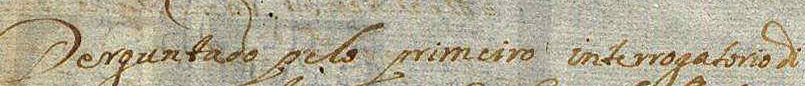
Perguntado pelo primeiro interrogatorio di
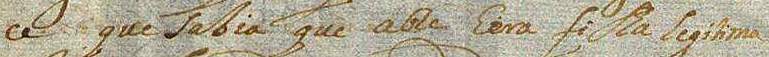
ce que sabia que a Re hera filha legitima
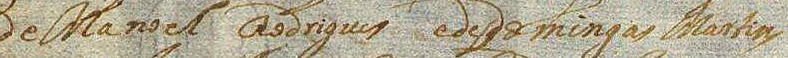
de Manoel Rodrigues e de Domingas Martins
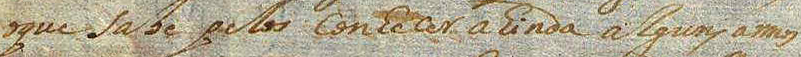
o que sabe pelos conhecer ahinda alguns annos
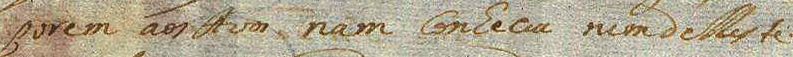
porem aos Avos nam Conheceu nem delles te
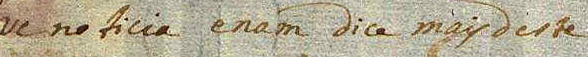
ve noticia e nam dice mais deste
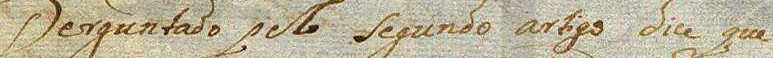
Perguntado pelo Segundo artigo dice que
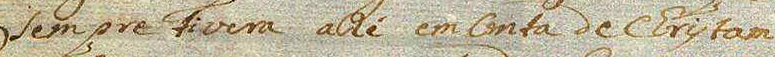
sempre tivera a Ré em conta de Christam
